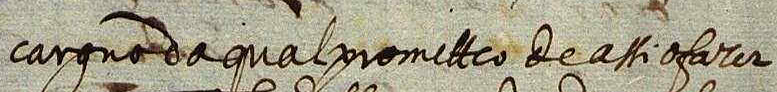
carguo do qual prometteo de assi o fazer
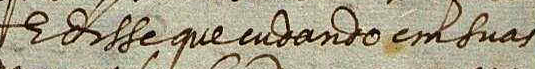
E disse que cudando em suas
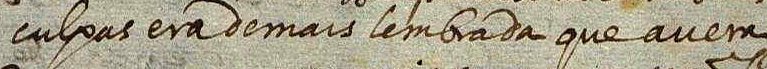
culpas era de mais lembrada que auera
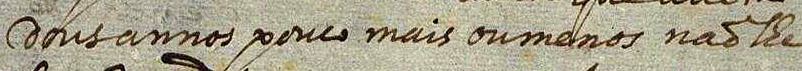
dous annos pouco mais ou menos naõ lhe
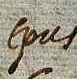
tpus
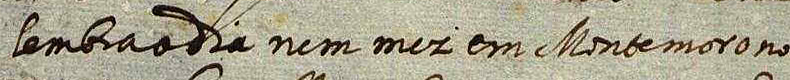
lembra o dia nem mez em Montemor o no
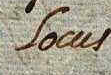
locus
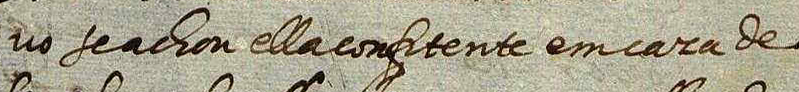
uo se achou ella confitente em caza de
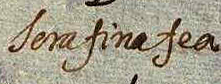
serafina fea
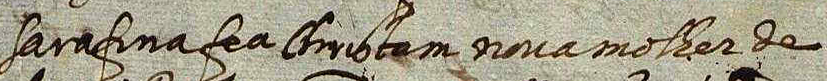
sarafina fea Christam noua molher de
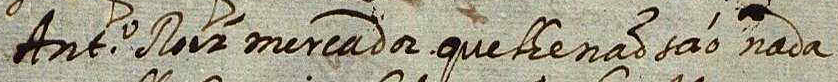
Ant.o Roiz̄ mercador que lhe não são nada
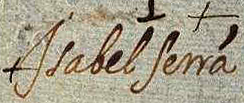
+ Jsabel Serrā
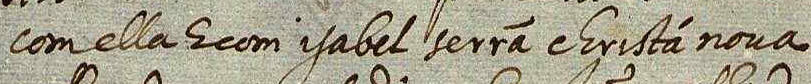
com ella E com Jsabel serrā christā noua
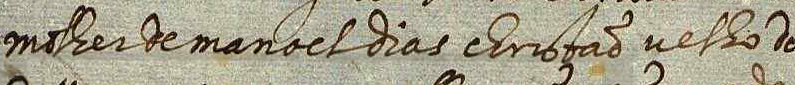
molher de manoel dias christaõ uelho do
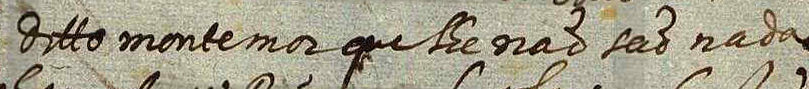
ditto montemor que lhe naõ saõ nada
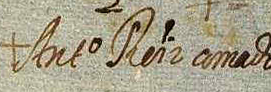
+ Anto Roīz amado
